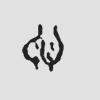𣶒
